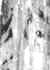水
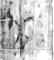凥（居）
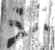之
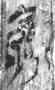寵
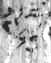婦
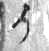人
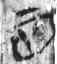正
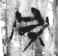凡
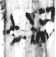坦
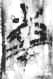南
